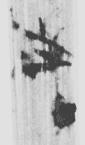之
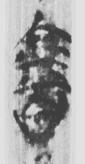銆
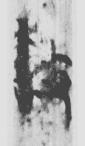{爻言攴}
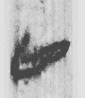㠯（以）
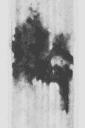{無攴}
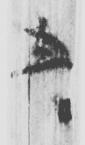之
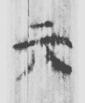亓
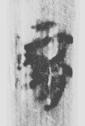所
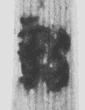訋
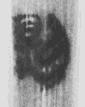則
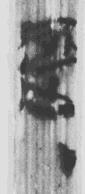{辶亙}
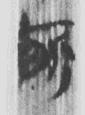所
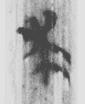求
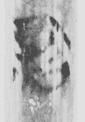則
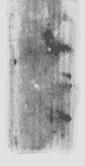廿六
